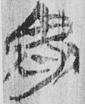{胃刀}（謂）
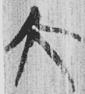大
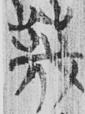○（慼）
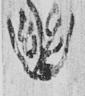幽
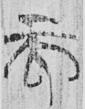而
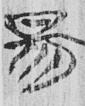昜（陽）
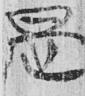是
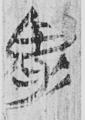{胃刀}（謂）
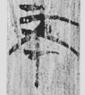不
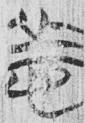恙（祥）
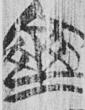齊齊
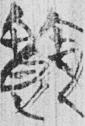節節
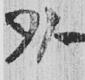外
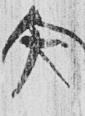内
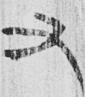又
